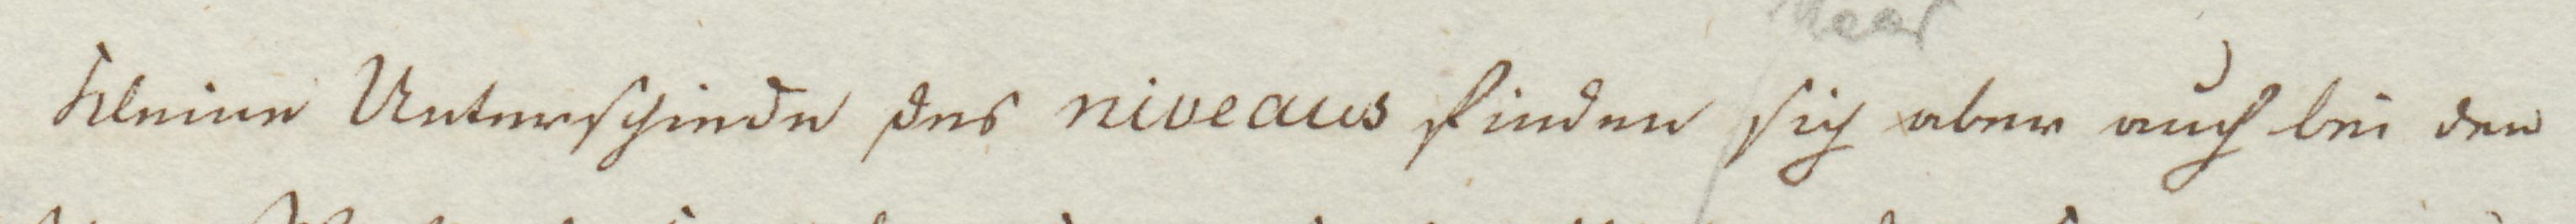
Kleine Unterschiede des niveaus finden sich aber auch bei den
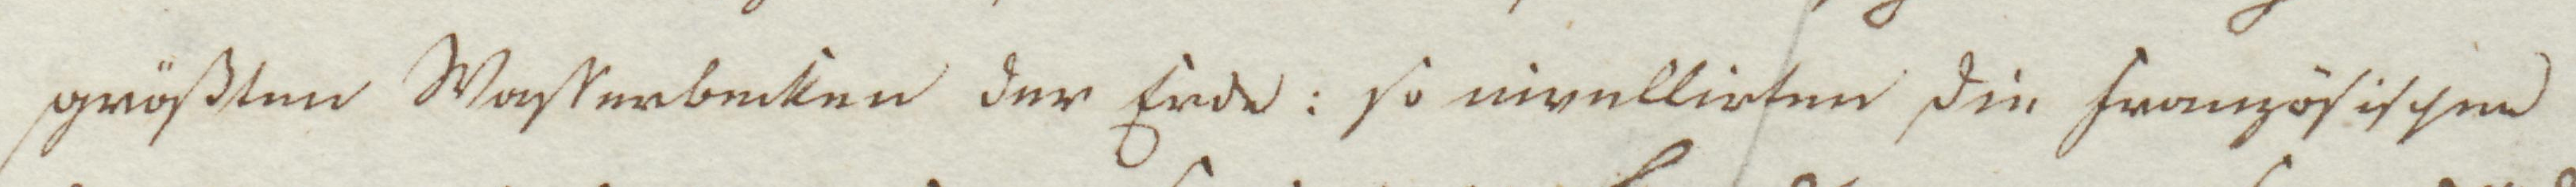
größten Wasserbecken der Erde: so nivellirten die Französischen
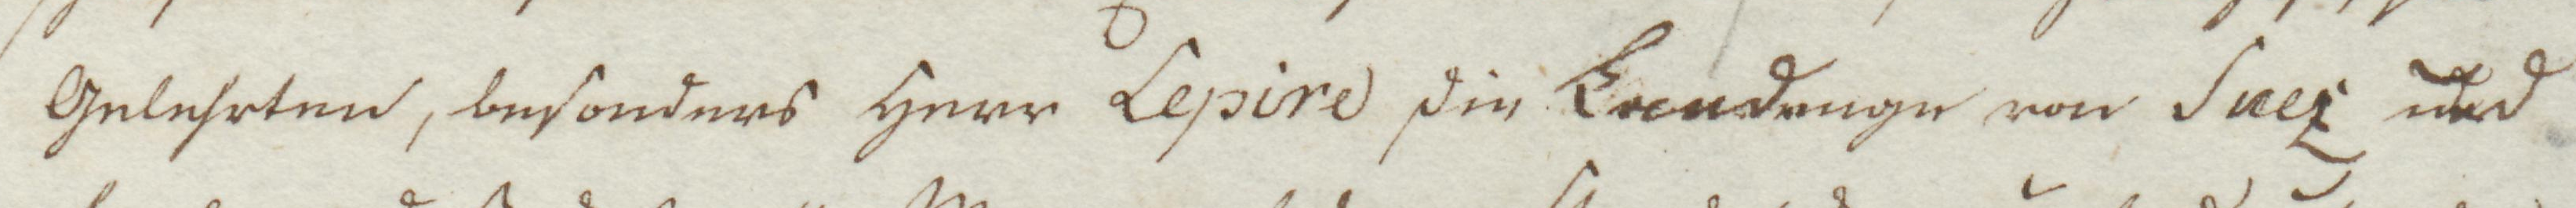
Gelehrten, besonders Herr Lepire die MeerLandenge von Suez u.und
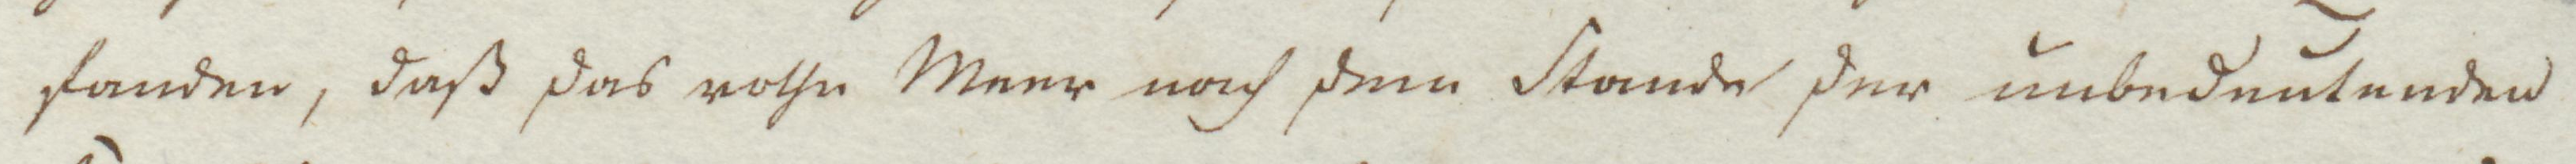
fanden, daß das rothe Meer nach dem Stande der unbedeutenden
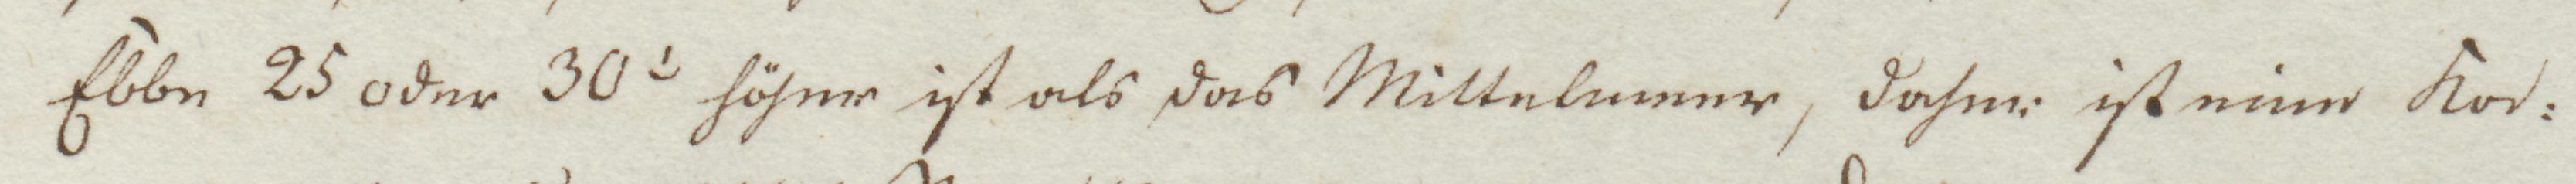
Ebbe 25 oder 30′ höher ist als das Mittelmeer, daher ist eine Ka-
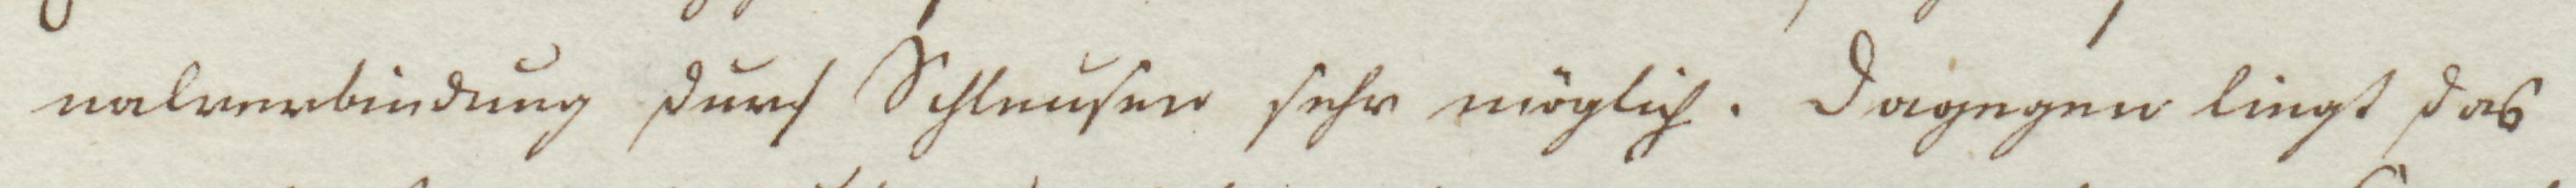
nalverbindung durch Schleusen sehr möglich. Dagegen liegt das
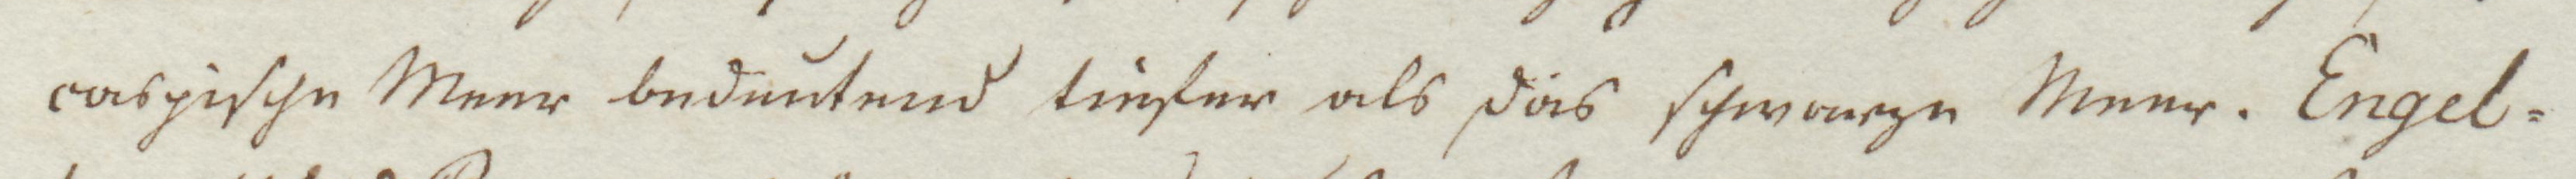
caspische Meer bedeutend tiefer als das schwarze Meer. Engel-
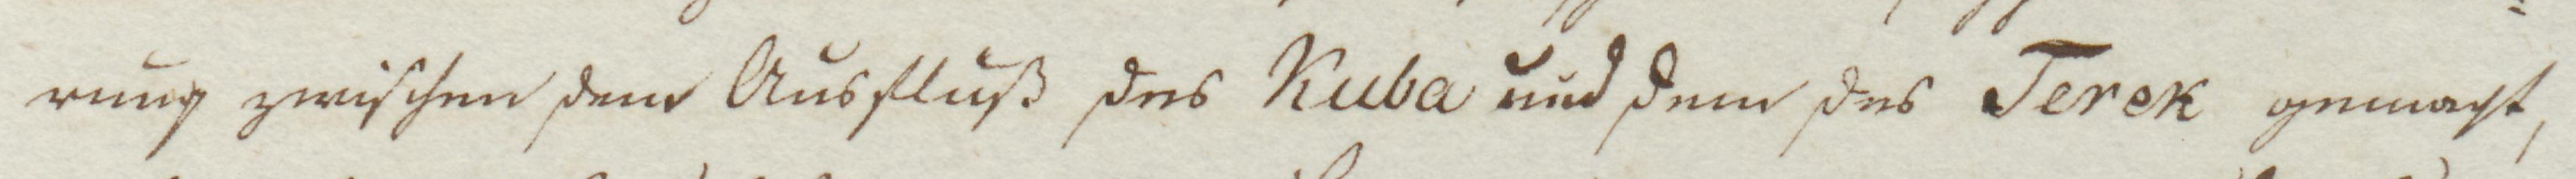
rung zwischen dem Ausfluß des Kuba u.und dem des Terek gemacht,
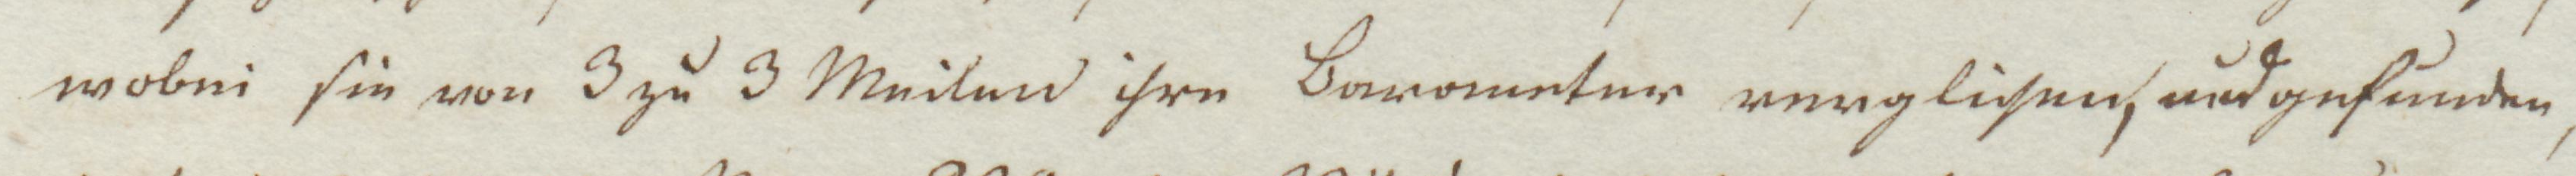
wobei sie von 3 zu 3 Meilen ihre Barometer verglichen, u.und gefunden,
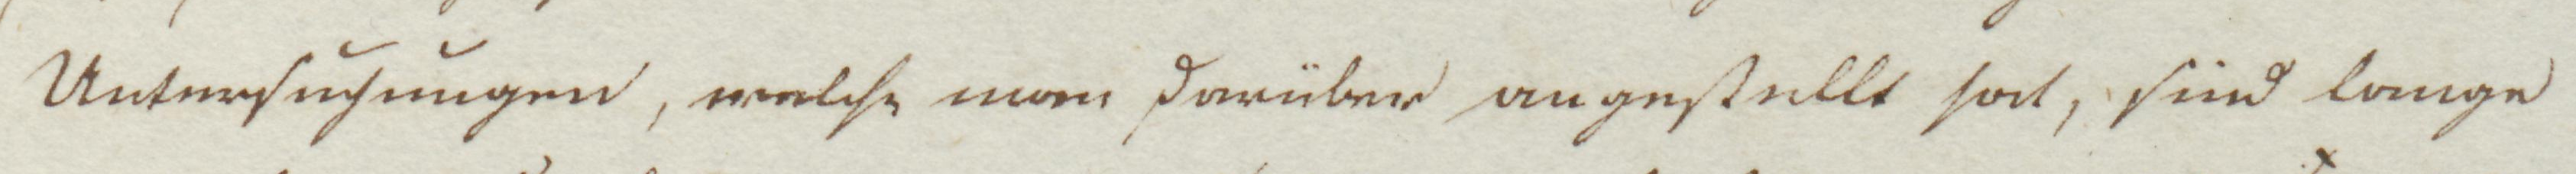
Untersuchungen, welche man darüber angestellt hat, sind lange
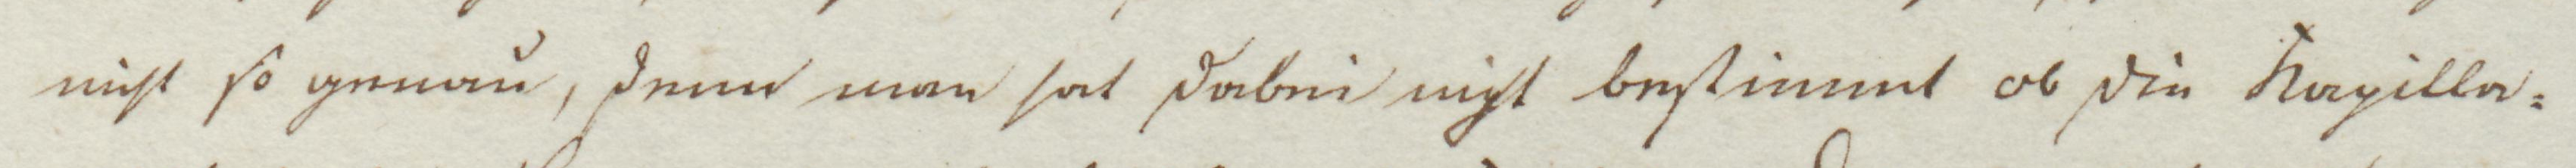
nicht so genau, denn man hat dabei nicht bestimmt ob die Kapilla-
